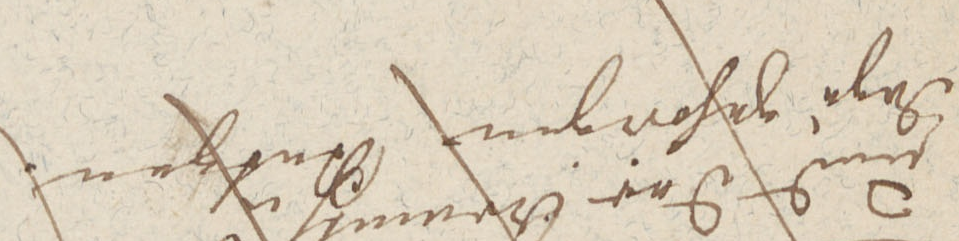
Stucco nachgeahmte Vorsprung eines
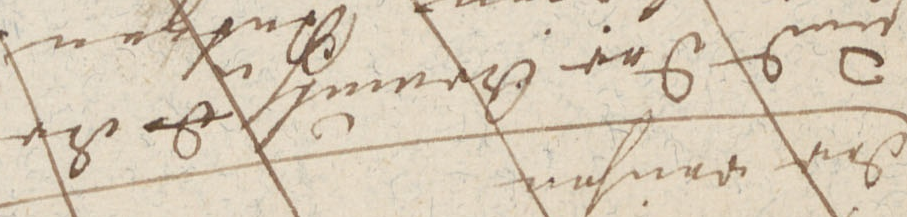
Deckenwerkes von nebeneinander
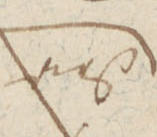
gelegten
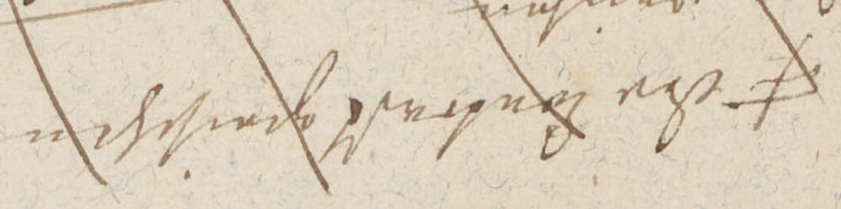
% der Contrast zwischen
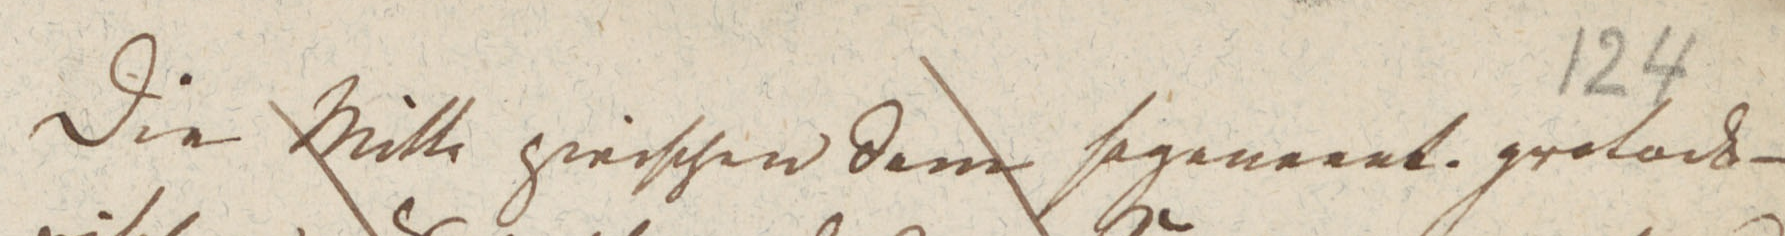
Die Mitte zwischen dem sogenannt protodo-
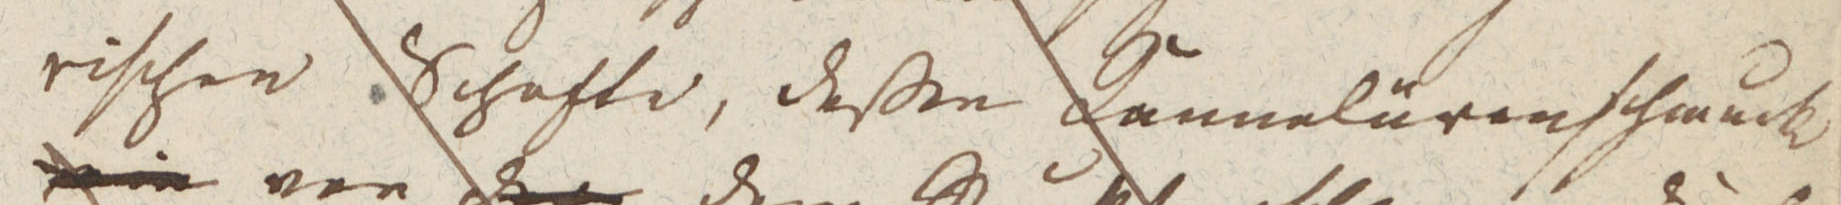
rischen Schafte, dessen Kannelürenschmuck
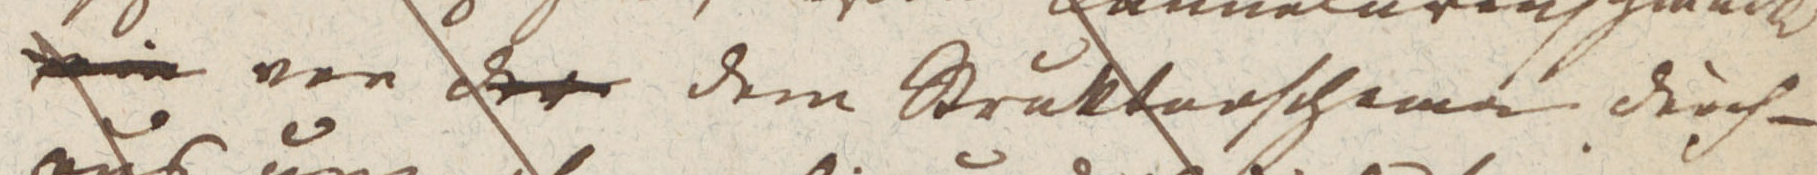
wie von der dem Strukturschema durch-
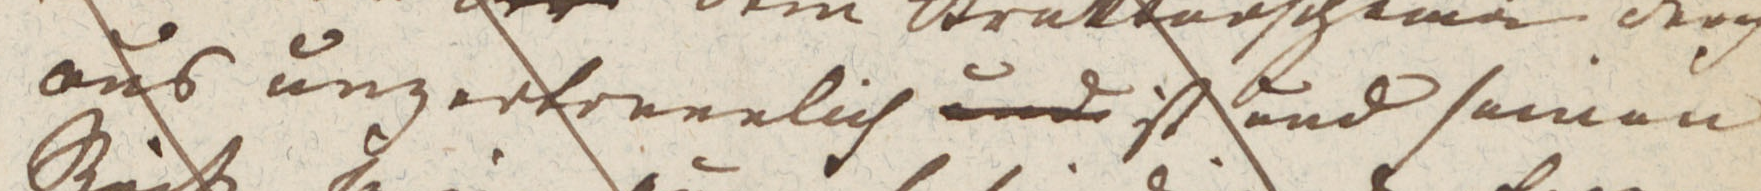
aus unzertrennlich und ist und seinen
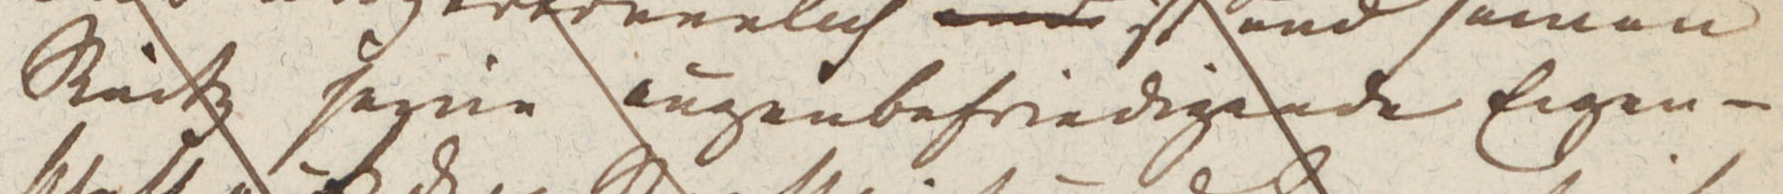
Reitz seine augenbefriedigende Eigen-
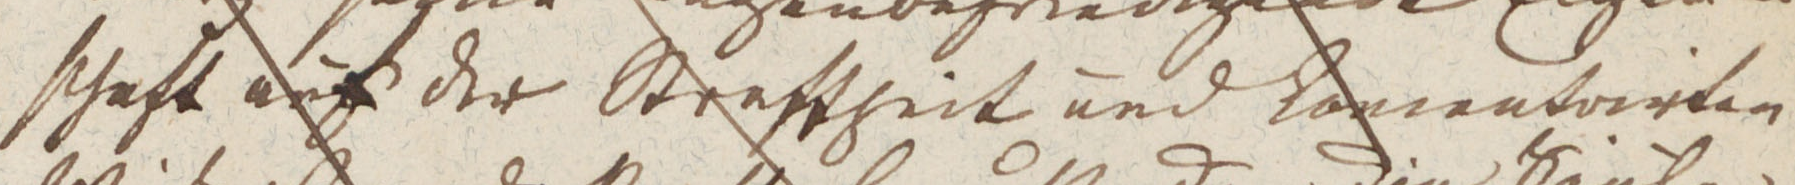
schaft auf der Straffheit und koncentrirten
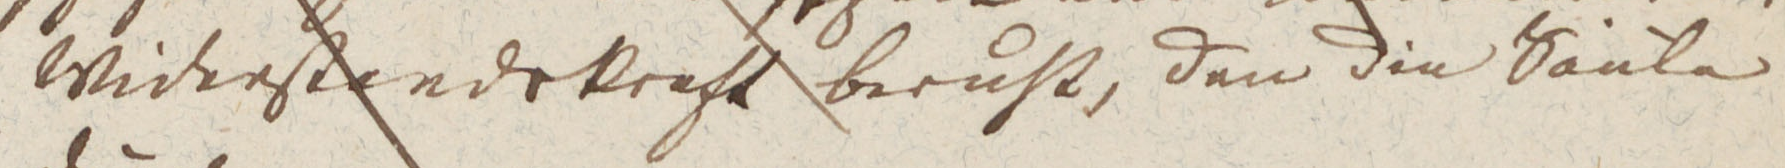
Widerstandskraft beruht, den die Säule
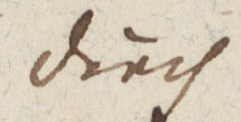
durch
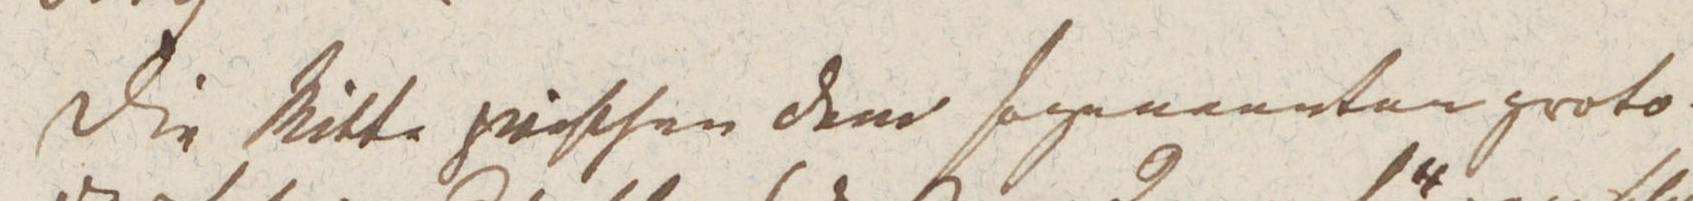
Die Mitte zwischen dem sogenannten proto-
